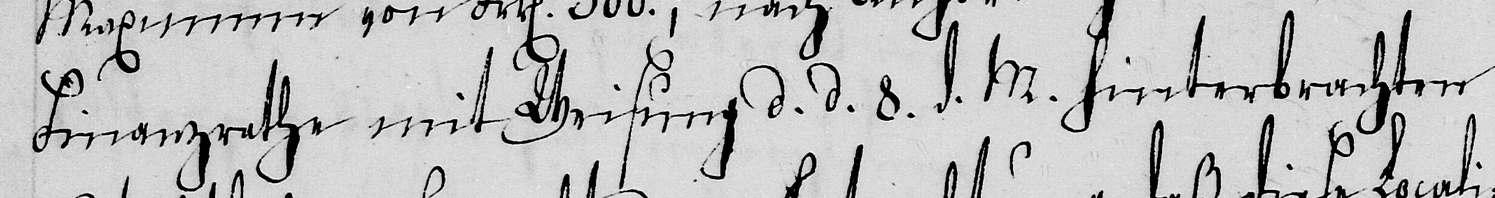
Finanzrathe mit Weisung d. d. 8. d. M. hinterbrachten
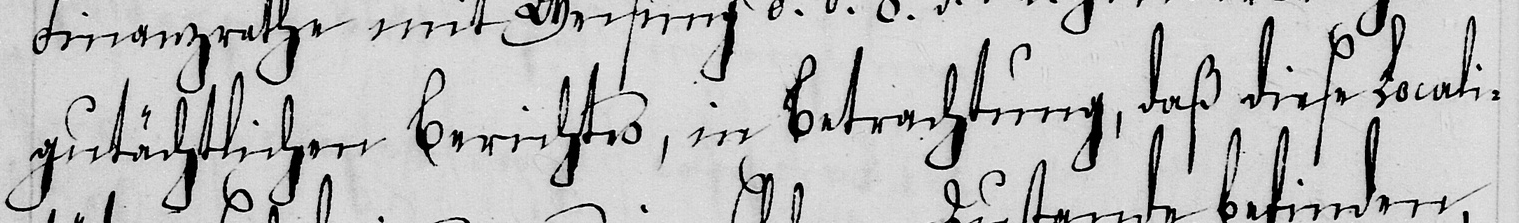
gutächtlichen Berichtes, in Betrachtung, daß diese Local¬
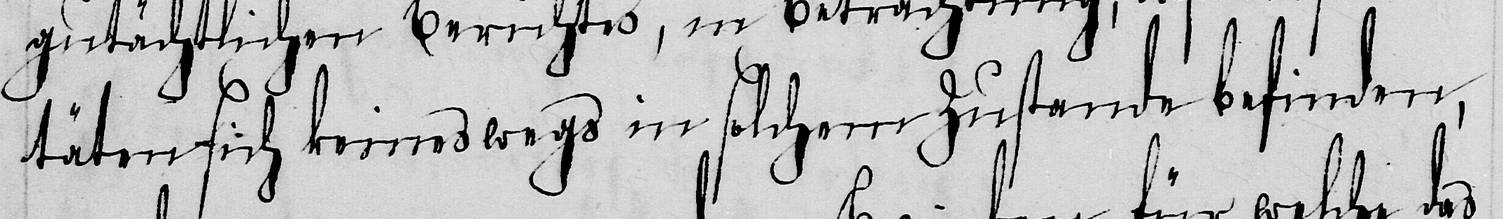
itäten sich keineswegs in solchem Zustande befinden,
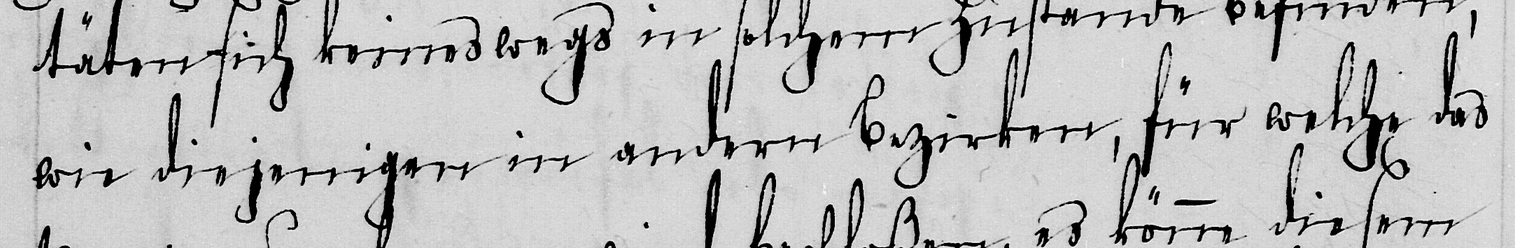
wie diejenigen in andern Bezirken, für welche das
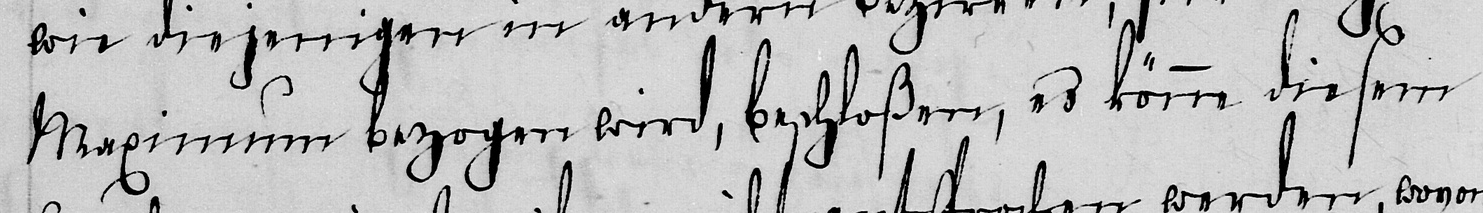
Maximum bezogen wird, beschloßen, es könne diesem
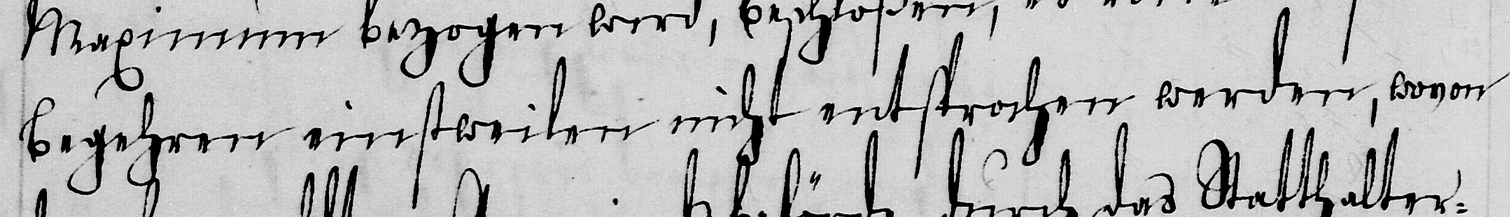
Begehren einstweilen nicht entsprochen werden, wovon
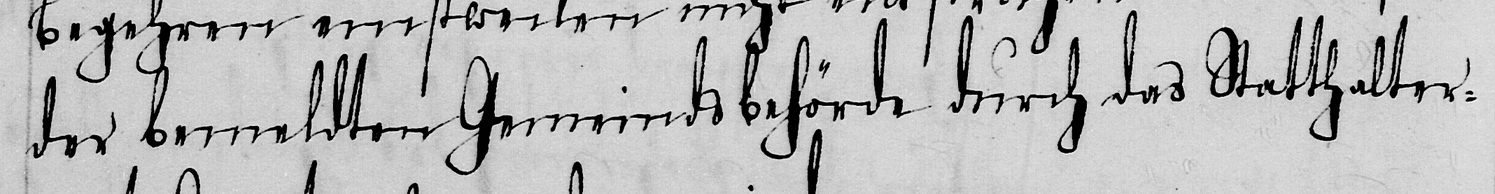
der bemeldten Gemeindsbehörde durch das Statthalter¬
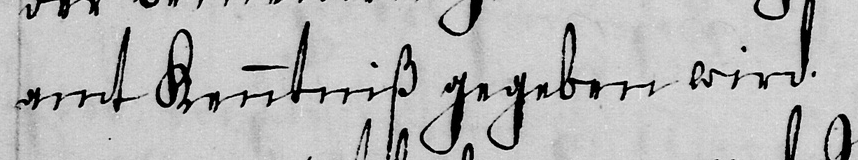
amt Kenntniß gegeben wird.
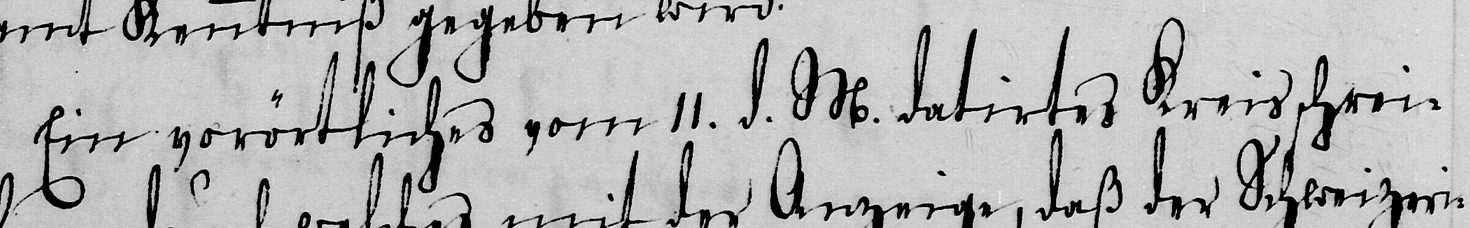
Ein vorörtliches vom 11. d. M. datirtes Kreisschrei¬
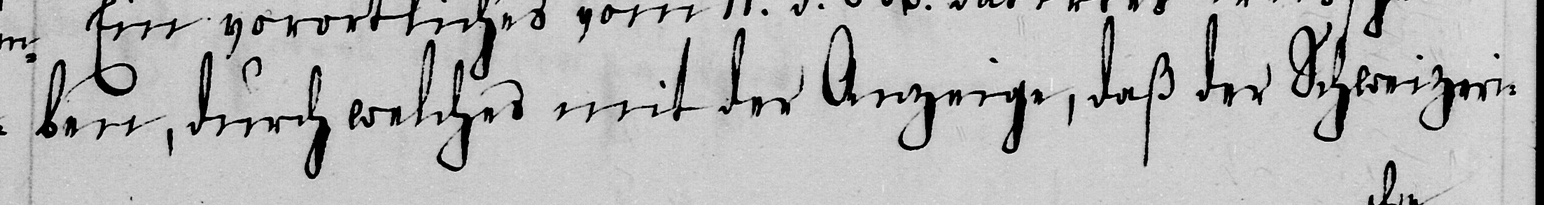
ben, durch welches mit der Anzeige, daß der Schweizeri-
